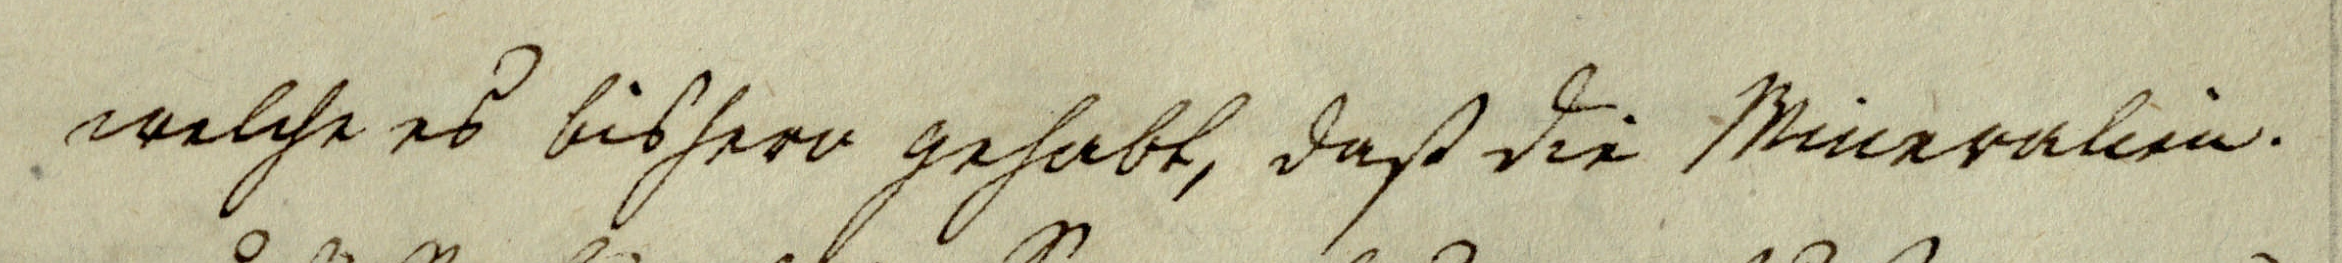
welche es bishero gehabt, daß die Mineralien¬
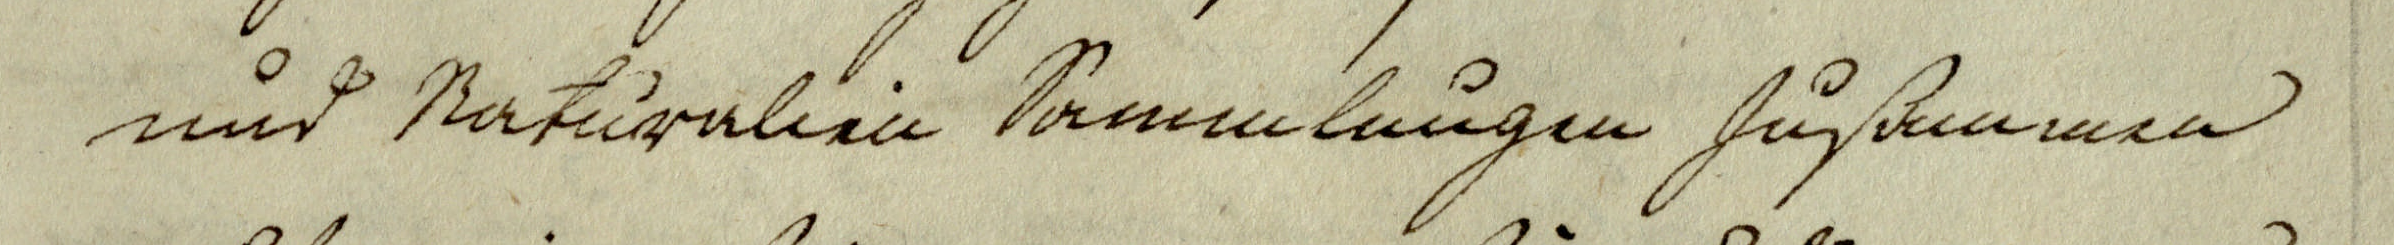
und Naturalien Sammlungen zusammen
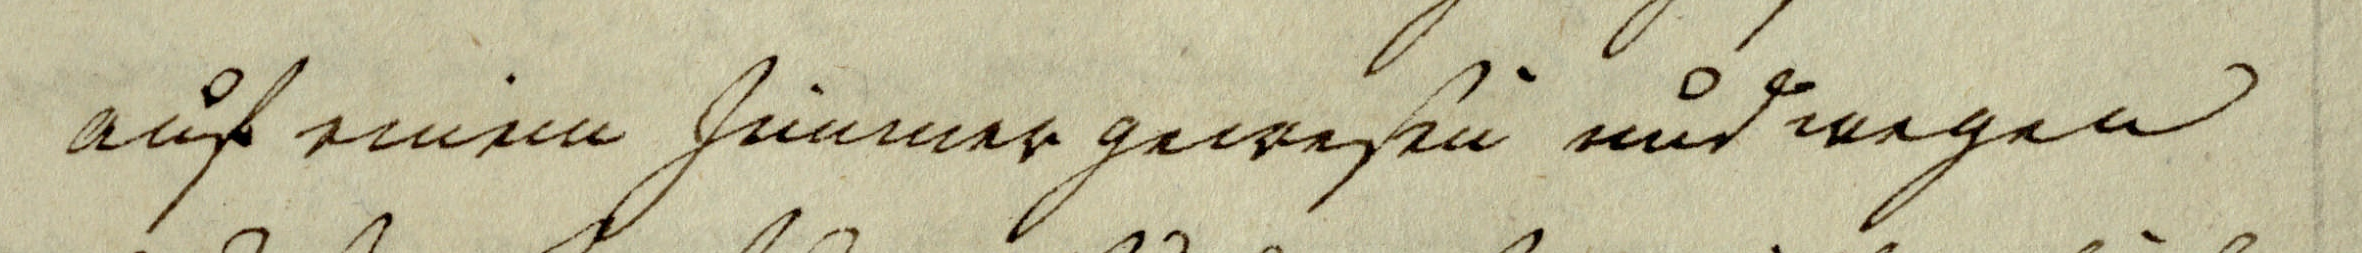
auf einem Zimmer gewesen und wegen
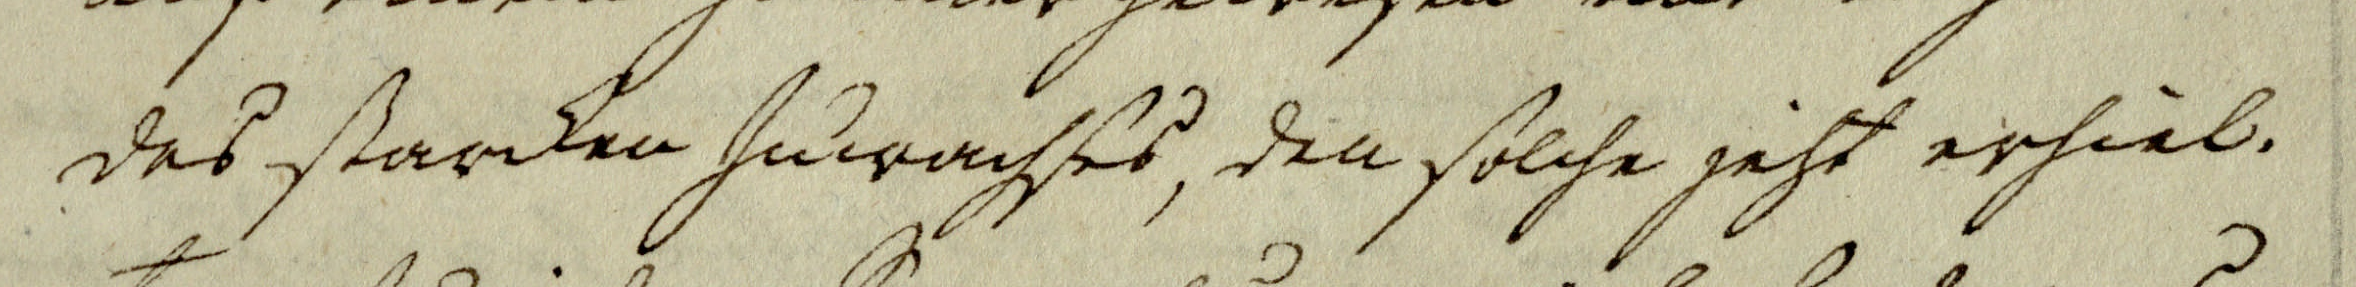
des starcken Zuwachses, den solche jetzt erhiel¬
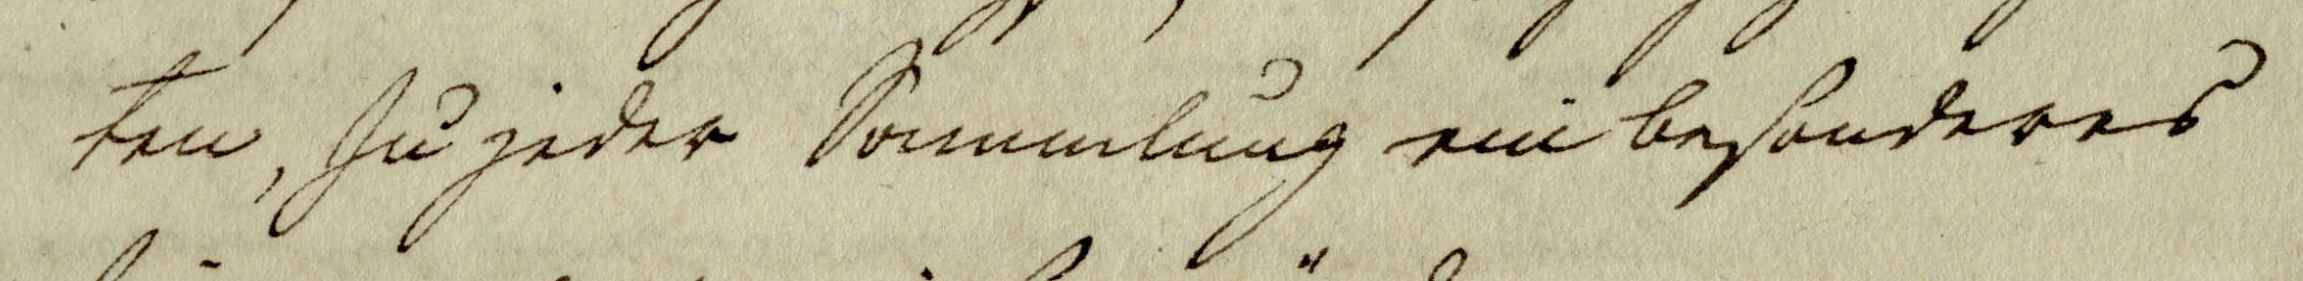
ten, zu jeder Sammlung ein besonderes
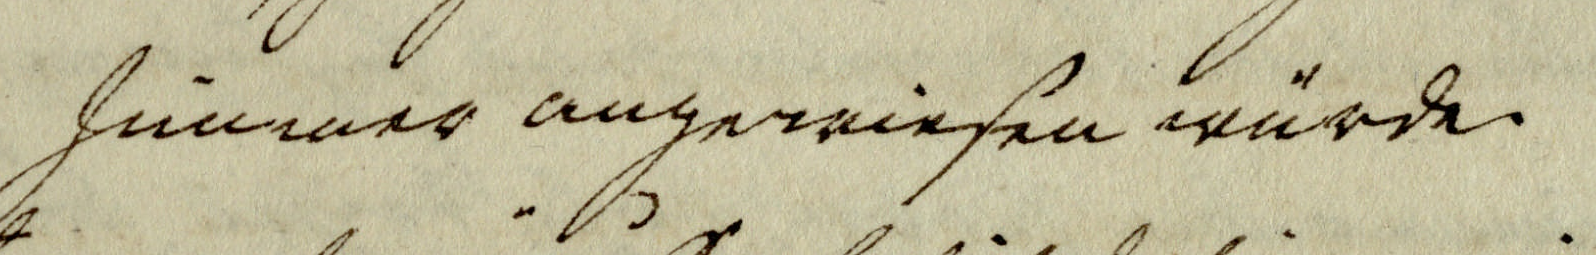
Zimmer angewiesen würde.
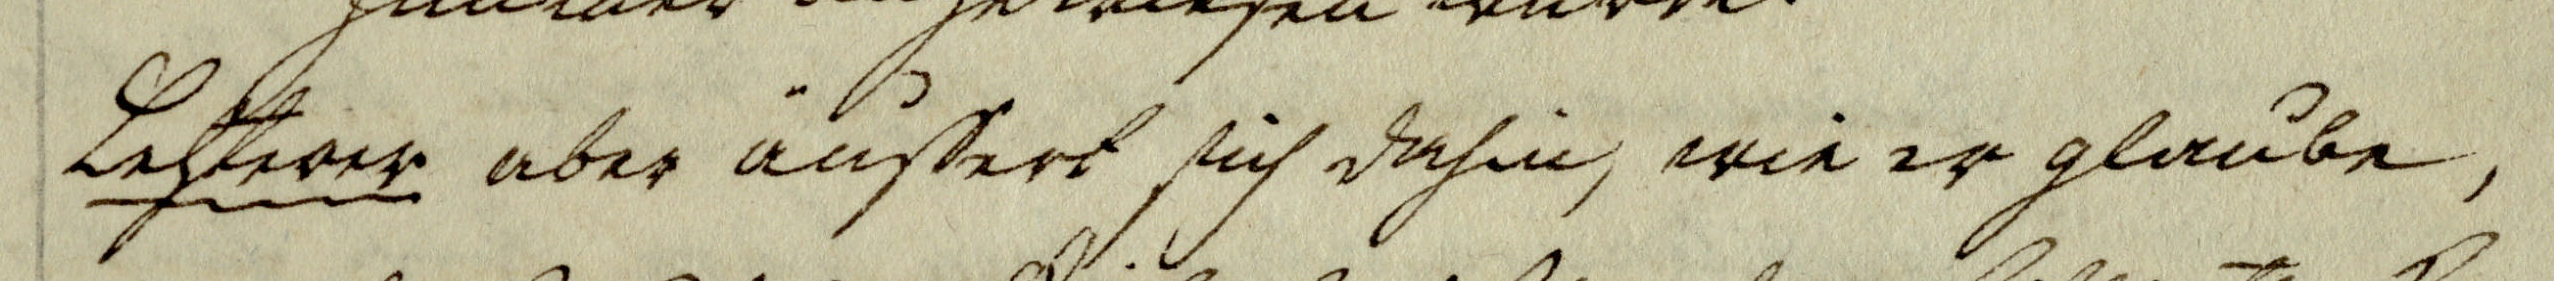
Letzterer aber äussert sich dahin, wie er glaube,
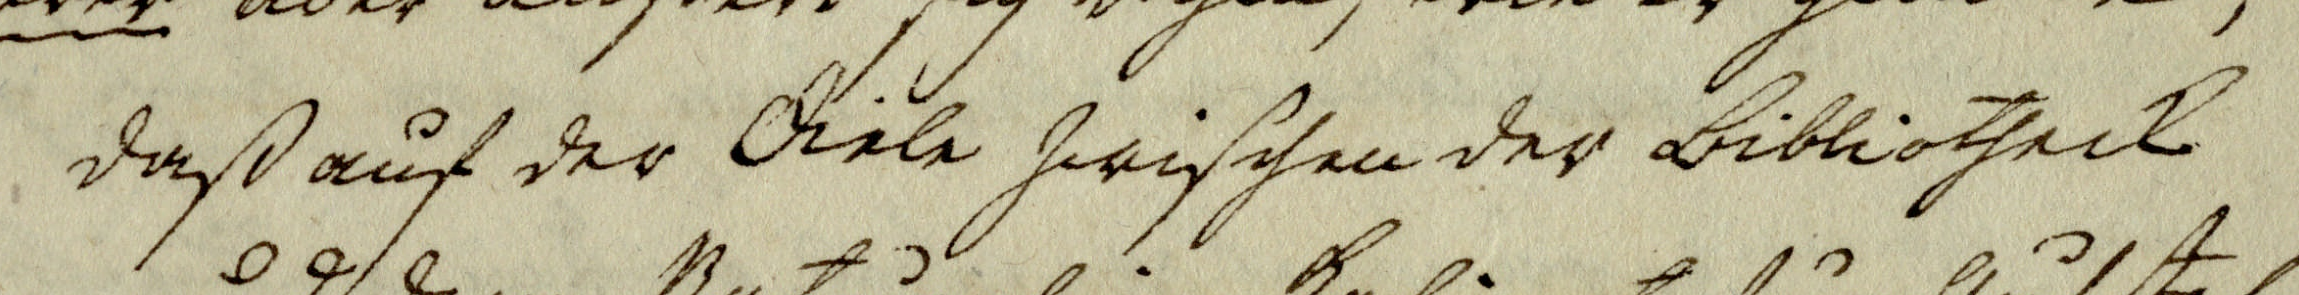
daß auf der Diele zwischen der Bibliotheck
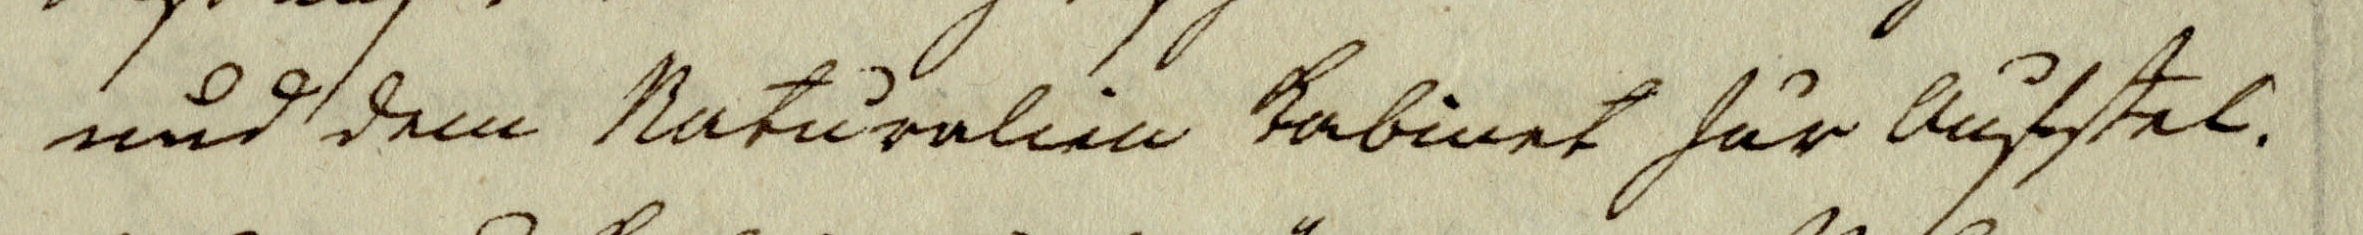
und dem Naturalien Kabinet zur Aufstel¬
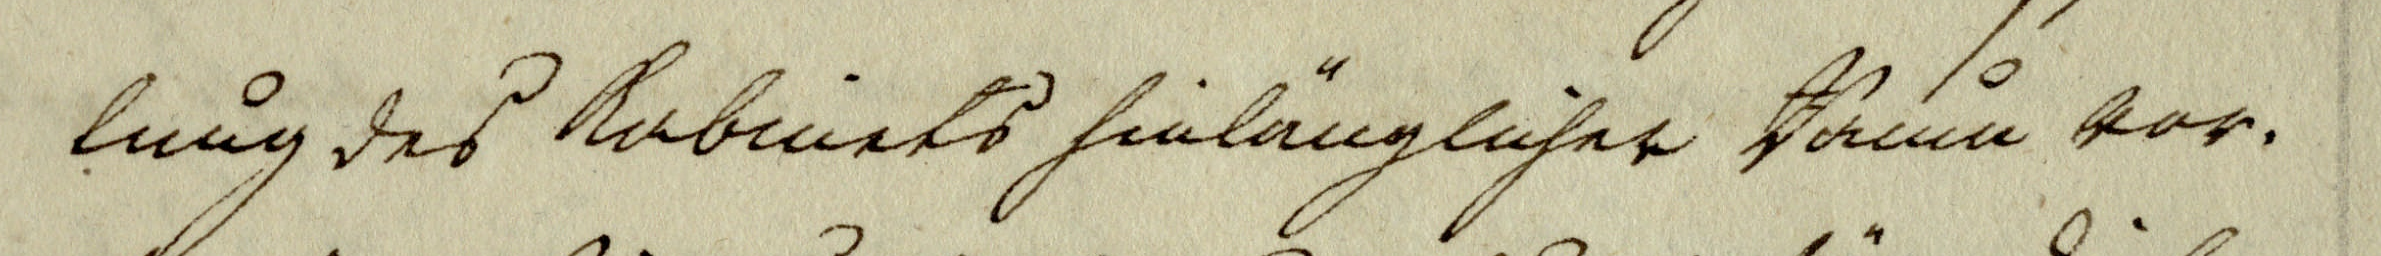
lung des Kabinets hinlänglicher Raum vor¬
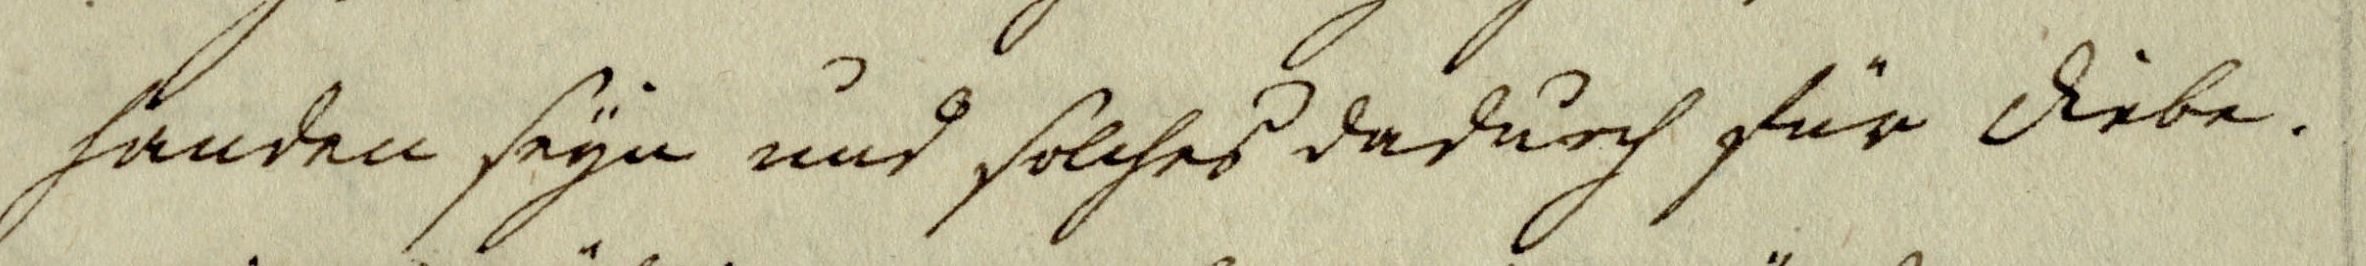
handen seÿn und solches dadurch für Diebe¬
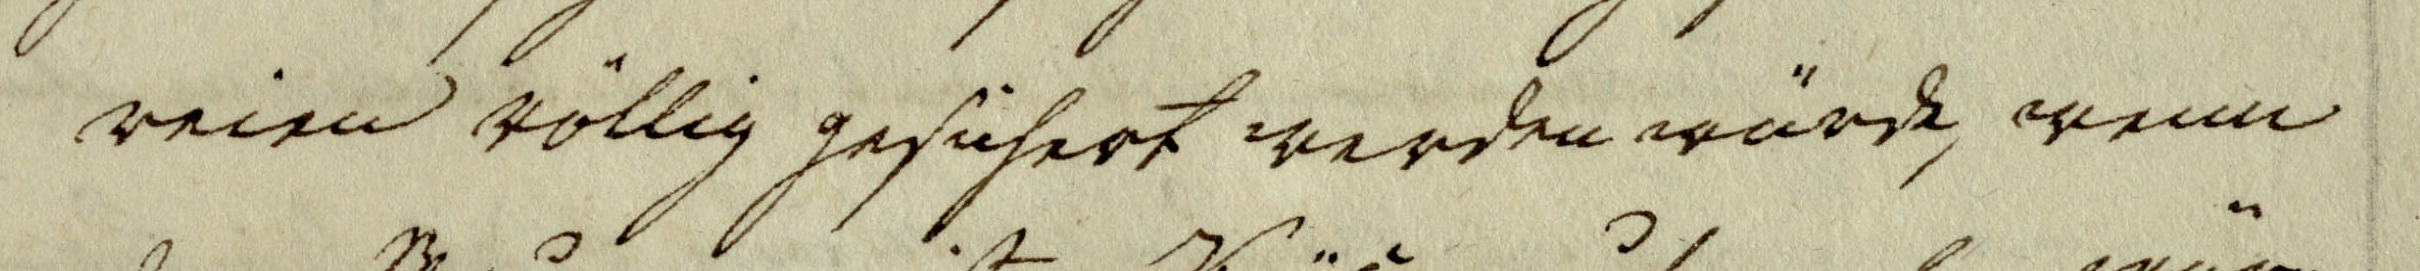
reien völlig gesichert werden würde, wenn
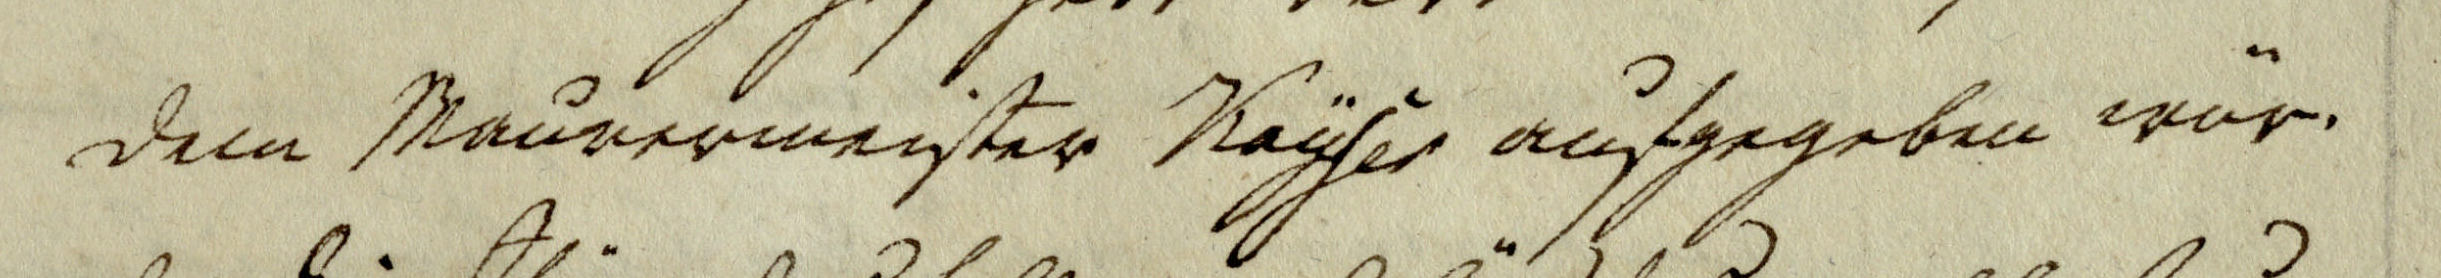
dem Maurermeister Kaÿser aufgegeben wür¬
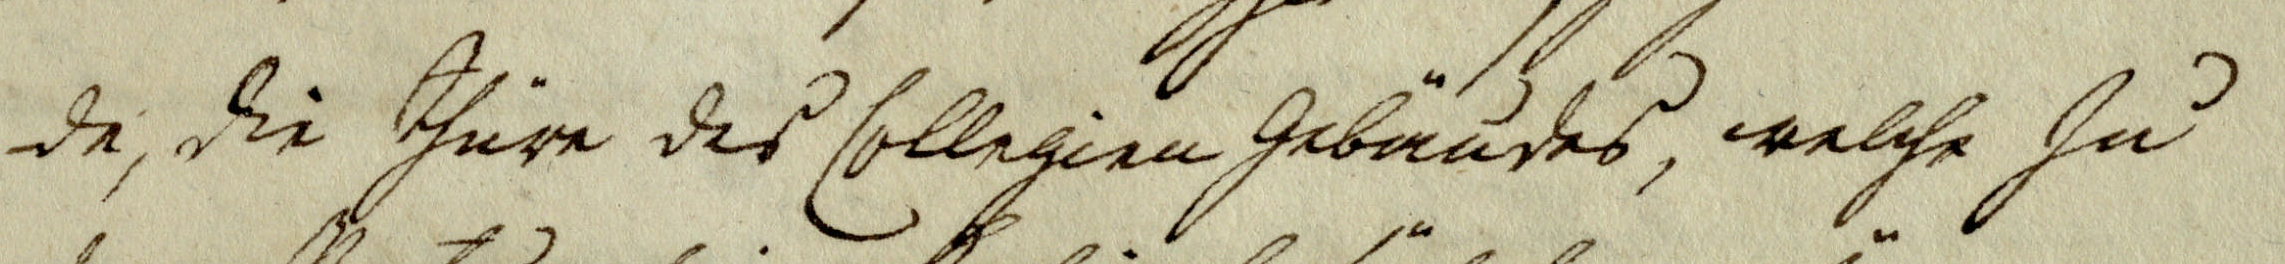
de, die Thüre des Collegien Gebäudes, welche zu
